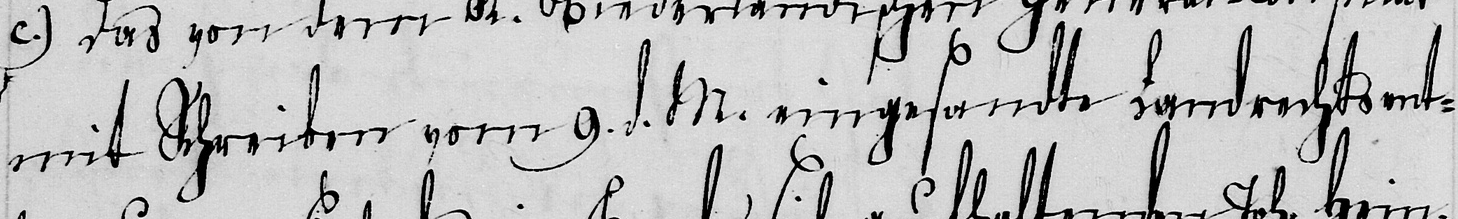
mit Schreiben vom 9. d. M. eingesandte Landrechtsent¬
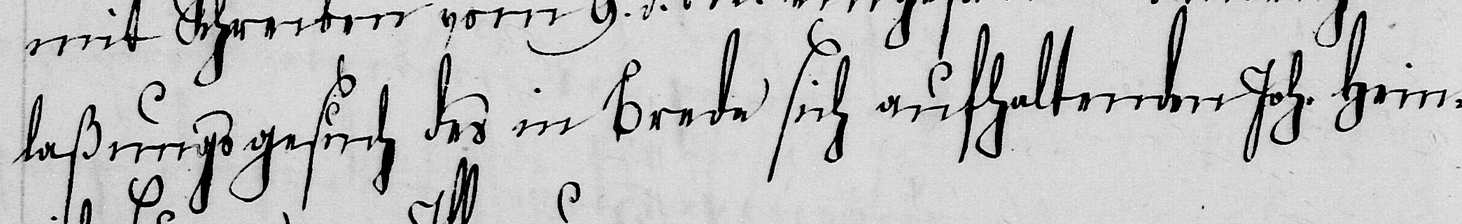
laßungsgesuch des in Brede sich aufhaltenden Joh. Hein¬
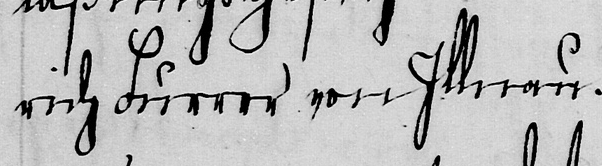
rich Furrer von Illnau.
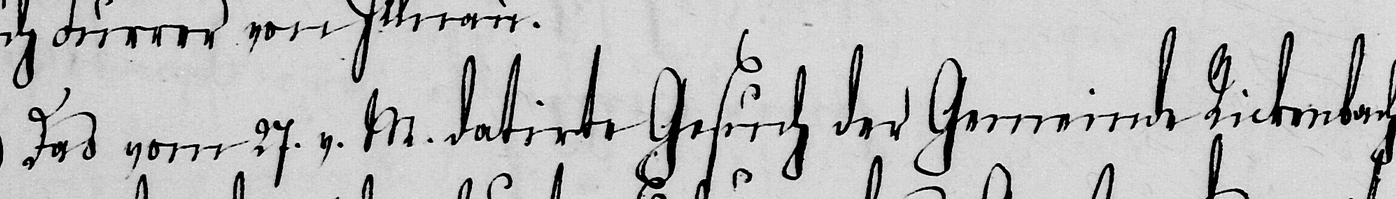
Das vom 27. v. M. datirte Gesuch der Gemeinde Rickenba¬
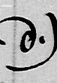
d.)
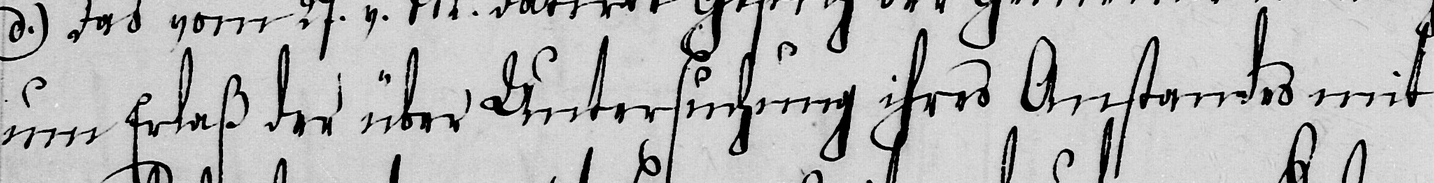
um Erlaß der über Untersuchung ihres Anstandes mit
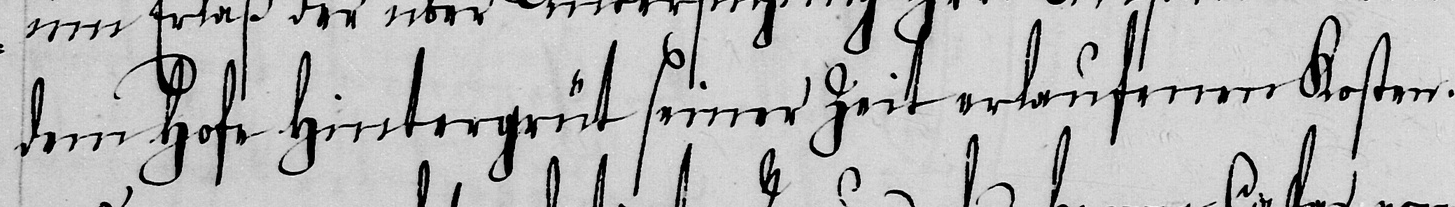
dem Hofe Hintergrüt seiner Zeit erlaufenen Kosten.
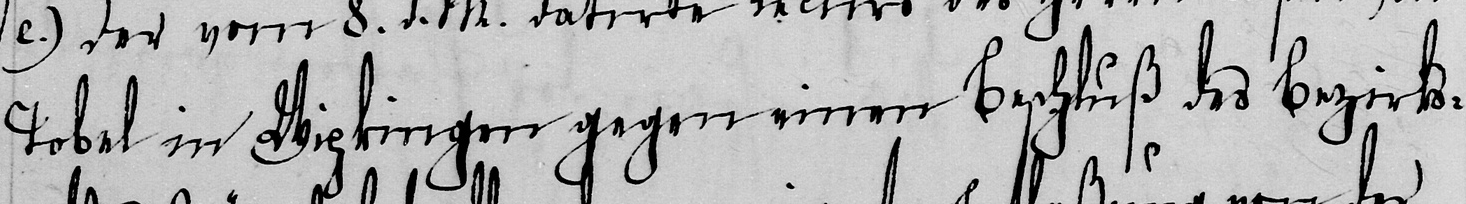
Tobel in Wipkingen gegen einen Beschluß des Bezirks¬
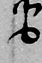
b.)
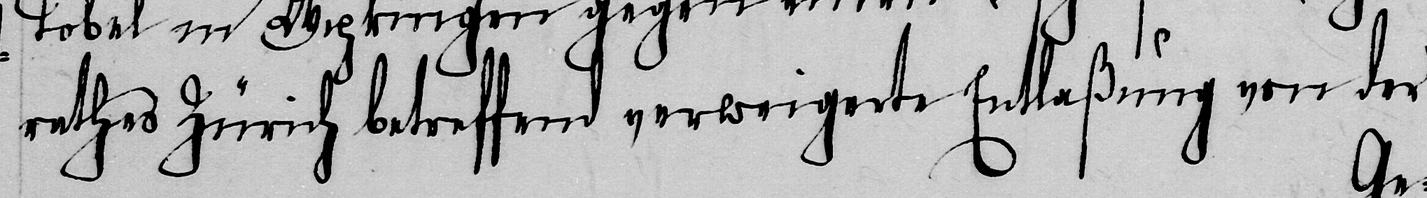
rathes Zürich betreffend verweigerte Entlaßung von der
